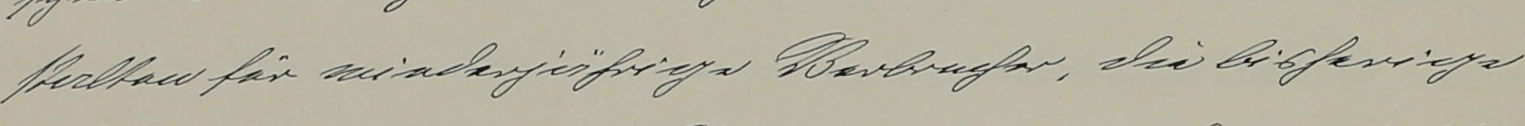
stalten für minderjährige Verbrecher, die bisherige
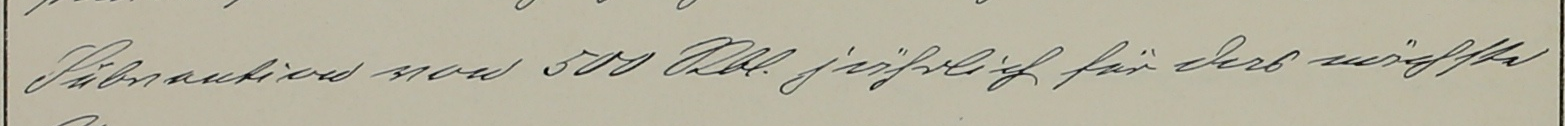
Subvention von 500 Rbl. jährlich für das nächste
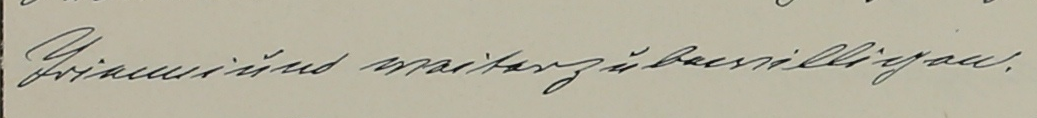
Triennium weiterzubewilligen.
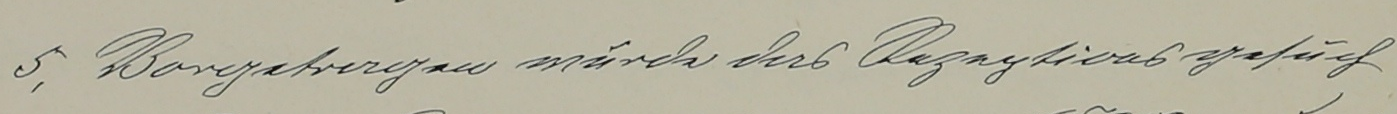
5. Vorgetragen wurde das Rezeptionsgesuch
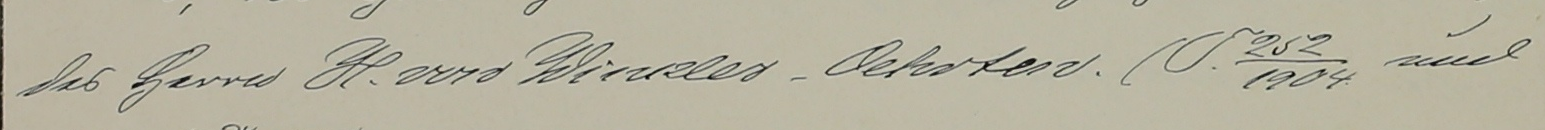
des Herrn H. von Winkler-Oehrten. (T.252/1904 und
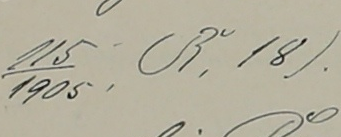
115/1905, R.18).
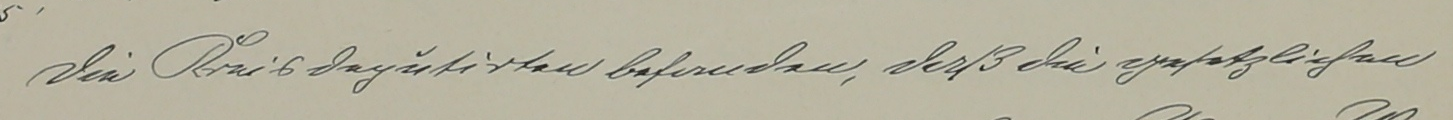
Die Kreisdeputirten befanden, daß die gesetzlichen
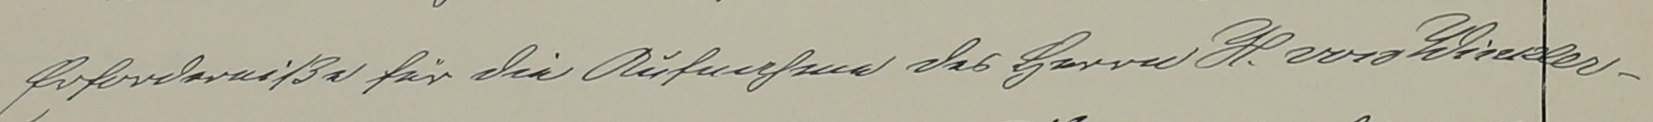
Erforderniße für die Aufnahme des Herrn H. von Winkler-
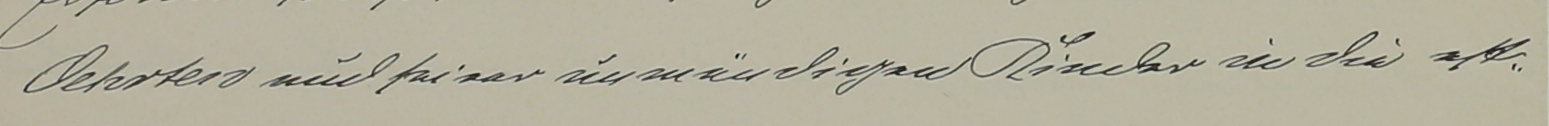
Oehrten und seiner unmündigen Kinder in die est-
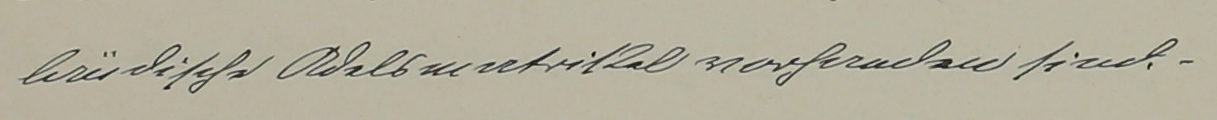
ländische Adelsmatrikel vorhanden sind.
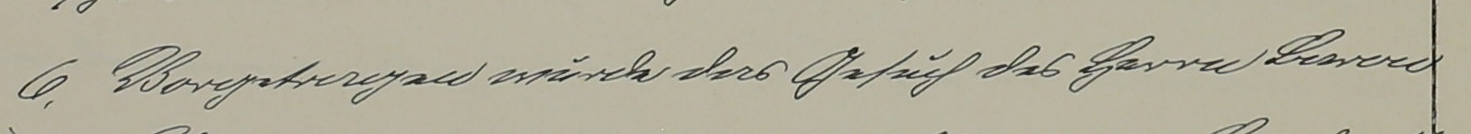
6. Vorgetragen wurde das Gesuch des Herrn Baron
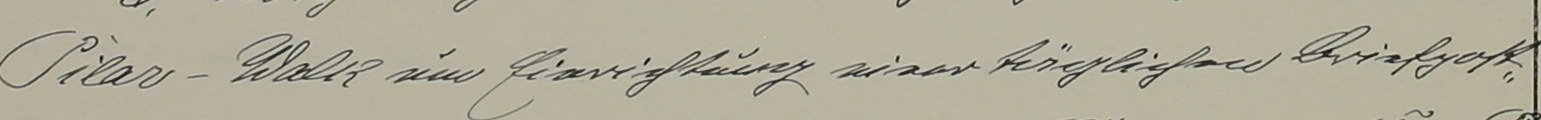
Pilar-Walk um Einrichtung einer täglichen Briefpost-
